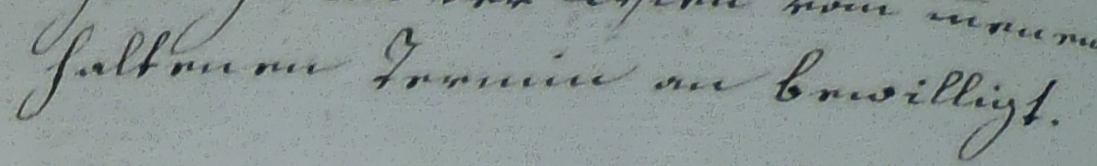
haltenen Termin an bewilligt.
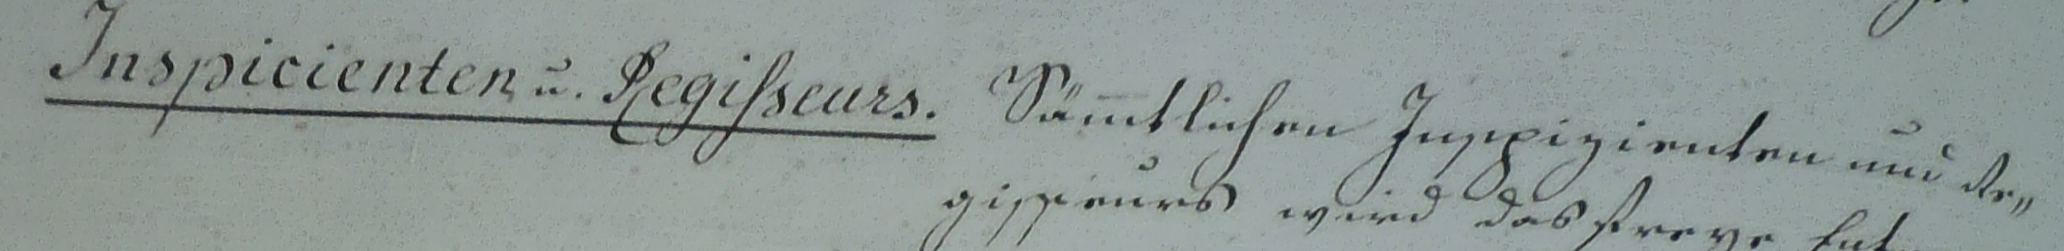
Inspicienten u. Regisseurs. Sämtliche Inspicienten und Re¬
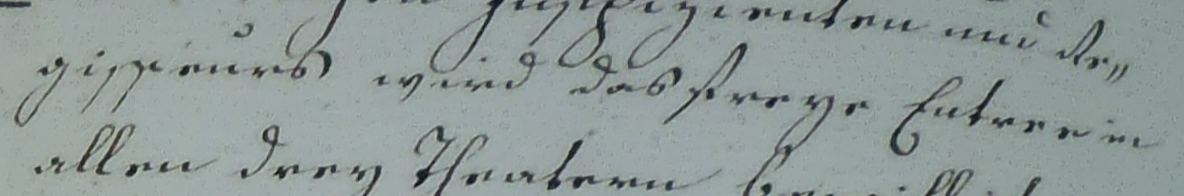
gisseurs wird das freye Entree in
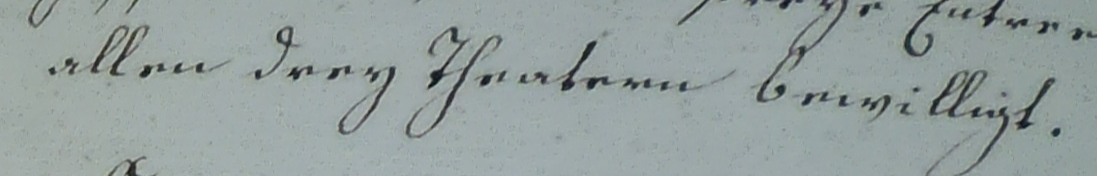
allen drey Theatern bewilligt.
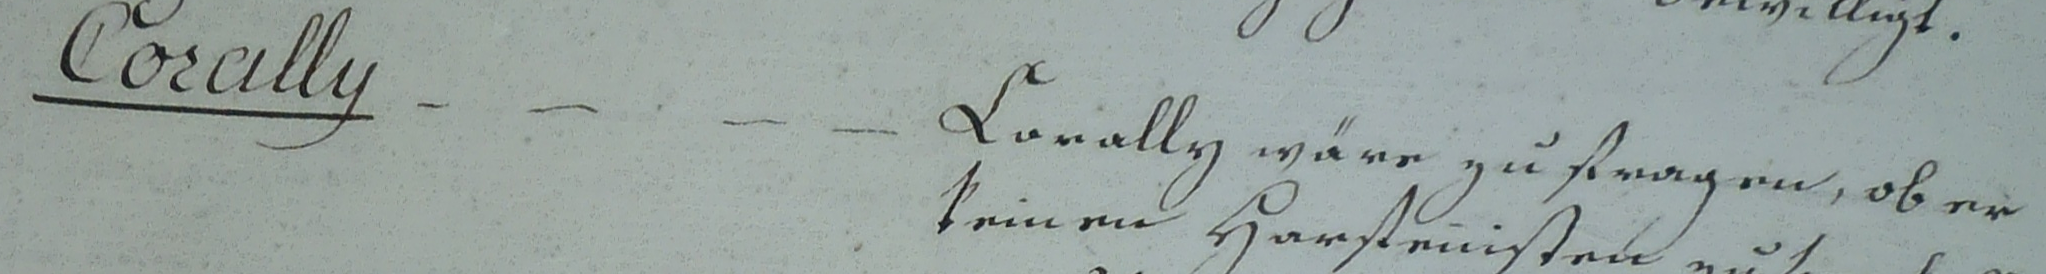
Corally _ _ _ _ Corally wäre zu fragen, ob er
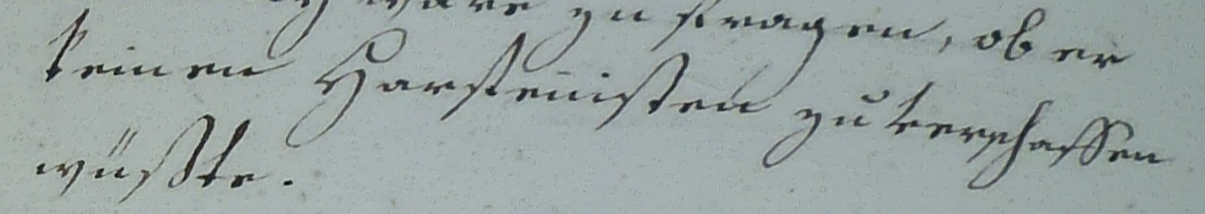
keinen Harfinisten zuverschaffen
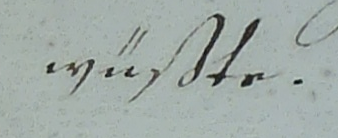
wüßte.
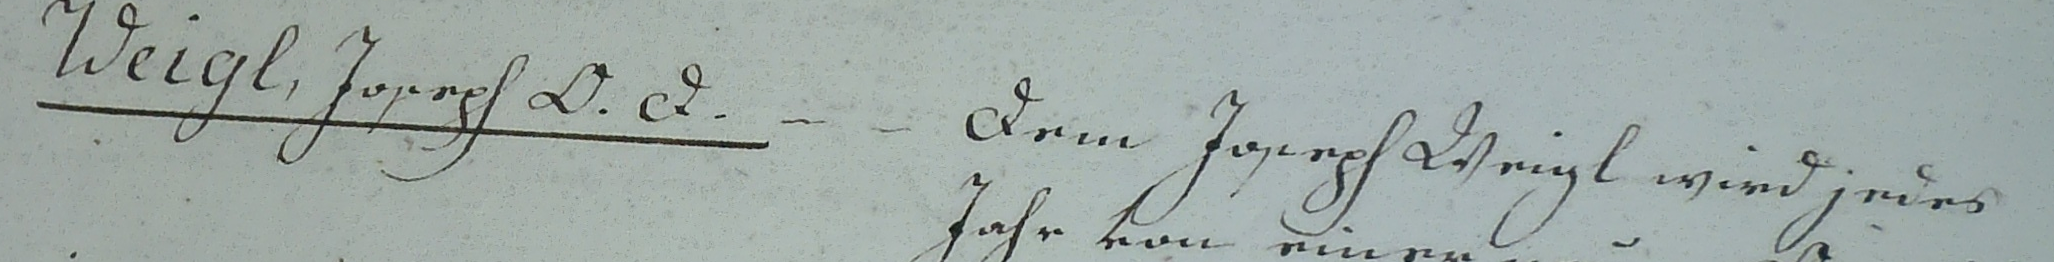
Weigl, Joseph O.D. _ _ Dem Joseph Weigl wird jedes
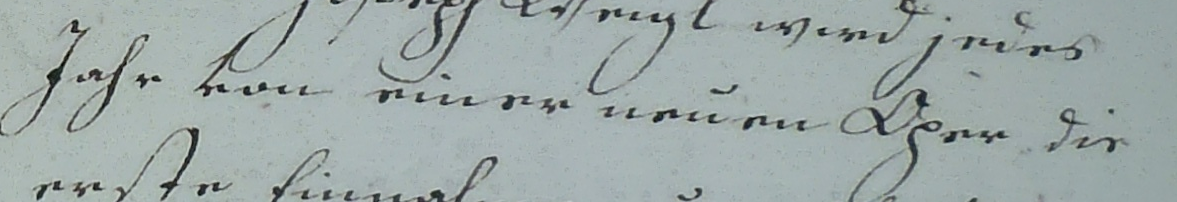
Jahr von einer neuen Oper die
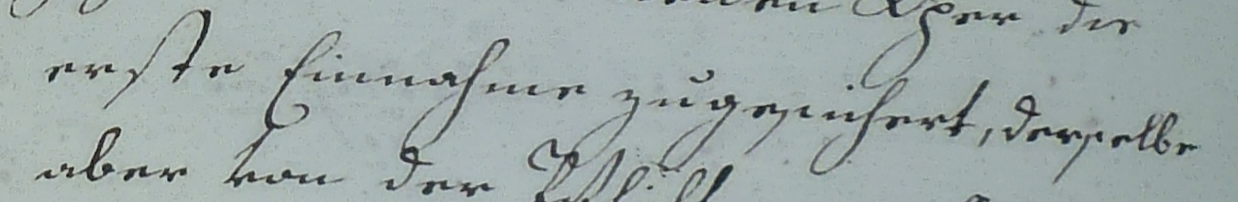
erste Einnahme zugesichert, derselbe
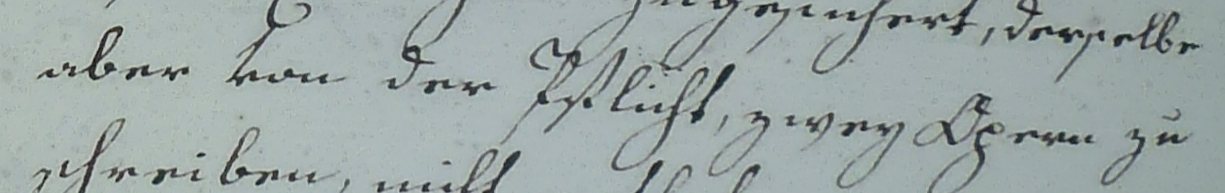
aber von der Pflicht, zwey Opern zu
